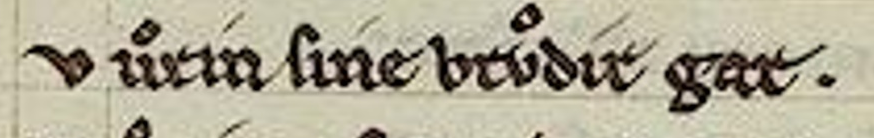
Vu°orin ſine brv°odir gar.
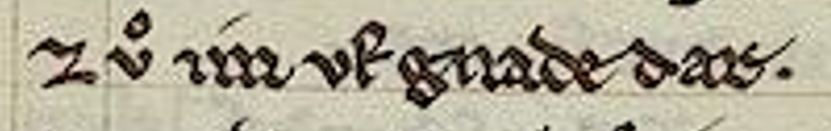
Zv°o im vf gnade dar.
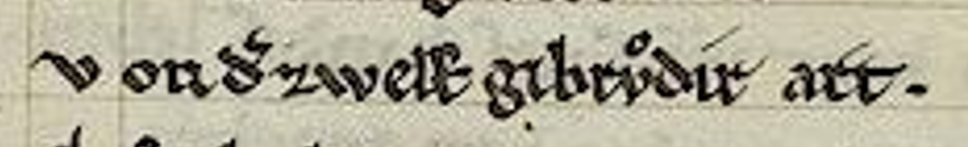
Von d(er) zwelf gibrv°odir art.
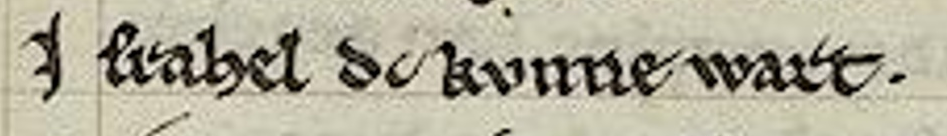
Iſrahel d(az) kvnne wart.
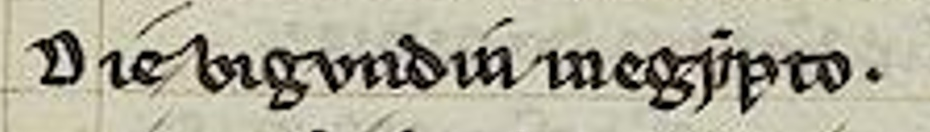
Die bigvndin inegypto.
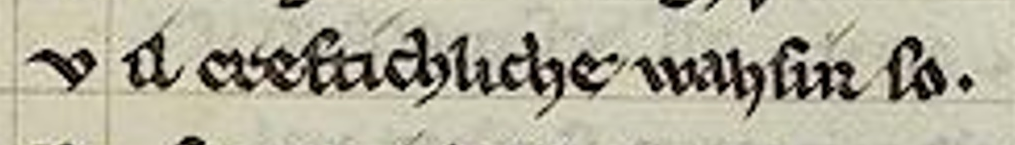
Vil creftichliche wahſin ſo.
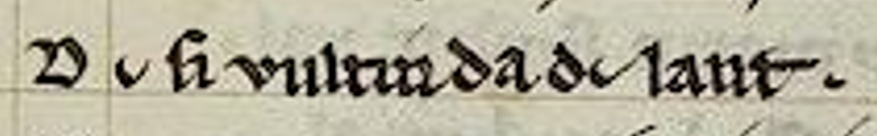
D(az) ſi vultin da d(az) lant.
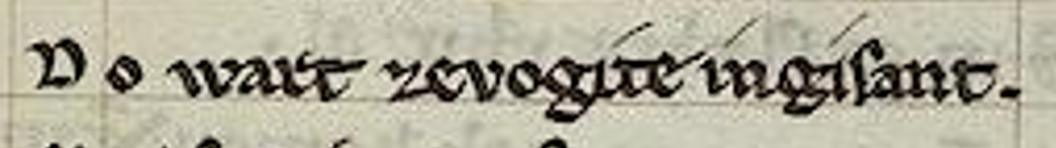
Do wart zevogite ingiſant.
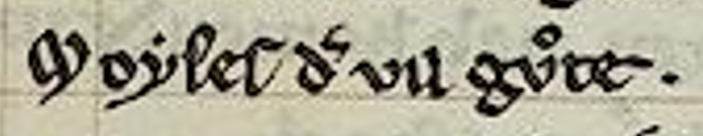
Moyſeſ d(er) vil gv°ote.
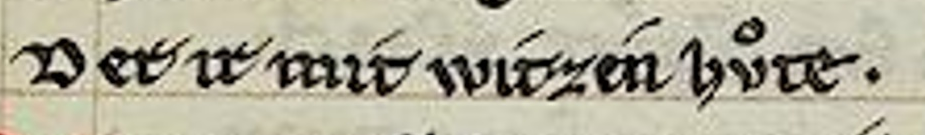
Der ir mit witzen hv°ote.
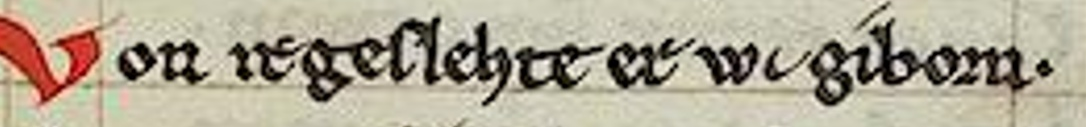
*Von irgeſlehte er w(az) giborn.
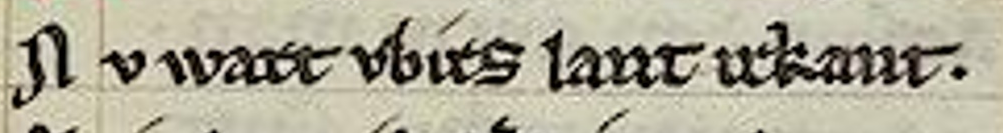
Nv wart vbirs lant irkant.
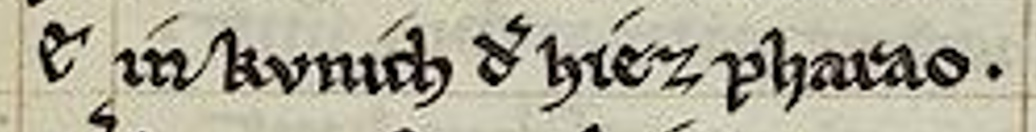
Ein kvnich d(er) hiez pharao.
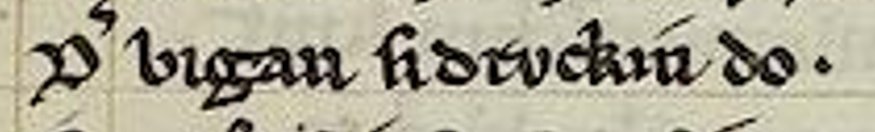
D(er) bigan ſi drvckin do.
